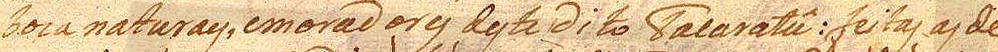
boza naturaes, e moradores deste dito Tacaratú: feitas as de
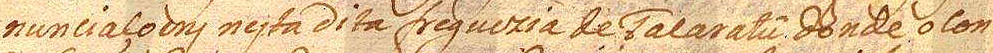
nunciaçoens nesta dita freguezia de Tacaratú donde o con
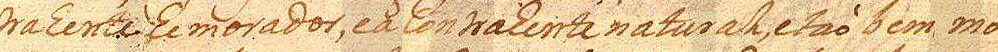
trahente he morador, e a contrahente naturaL, e taõbem mo
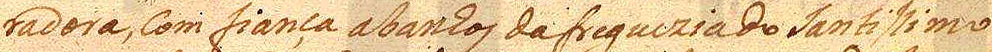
radora, com fiança a banhos da freguezia do Santissimo
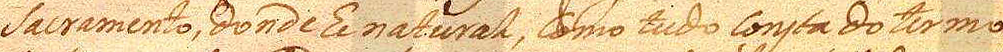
Sacramento, donde he naturaL, como tudo consta do termo
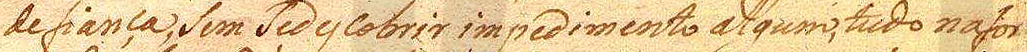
de fiança, sem se descobrir impedimento algum, tudo na for
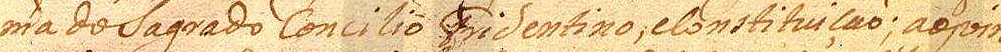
ma do Sagrado Concilio Tridentino, e constituiçaõ; aos vin
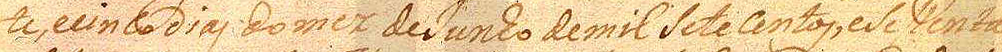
te, e cinco dias do mez de Iunho de mil Setecentos, e sessenta
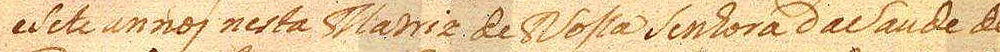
e Sete annos nesta Matriz de Nossa Senhora da Saude de
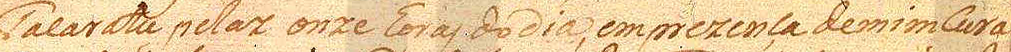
Tacaratú pelaz onze horas do dia, em prezença de mim Cura
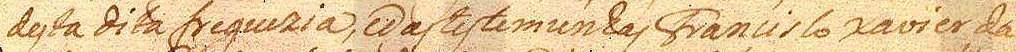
desta dita freguezia, e das testemunhas FrancisCo xavier da
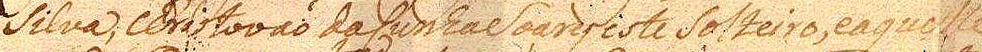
Silva, christovaõ da Cunha Soares este Solteiro, e aquelle
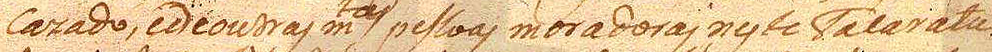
cazado, e de outras mtas pessoas moradoras neste Tacaratu
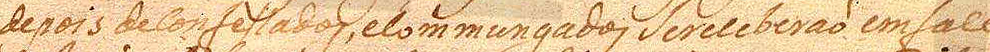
depois de Confessados, e Commungados Sereceberaõ em face
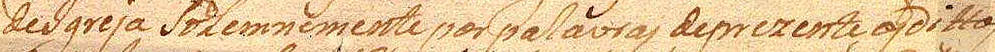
de Igreja SoLemnemente por palavras de prezente os dittos
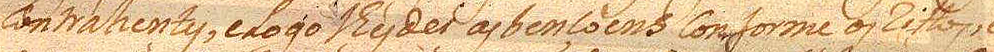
contrahentes, e Logo lhes dei as bençoens conforme os Rittos, e
